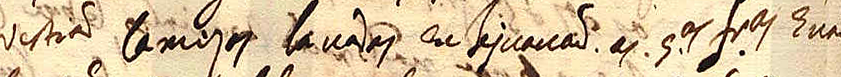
vestiaõ Camizas lauadas Ee Iejuauaõ as 5.as fr.as E naõ
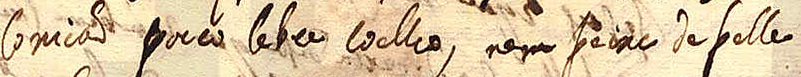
Comiaõ porco lebre coelho, nem peixe de pelle
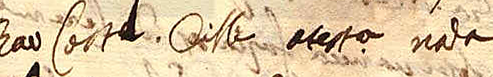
E ao Coste. disse a test.a nada
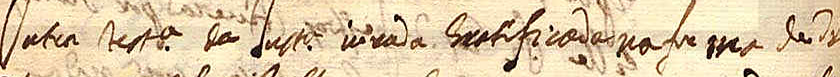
Outra test.a da Iust.a iurada E ratificada na forma de drto
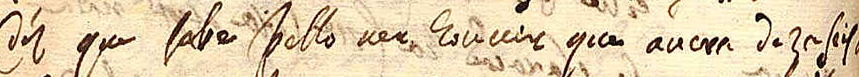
diz que sabe pello uer E ouuir que auera dezaseis a
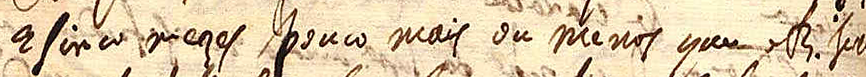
E sinco mezes pouco mais ou menos que o R. Jero
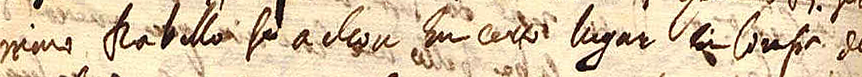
nimo Rabello se achou En certo lugar En Conpa de
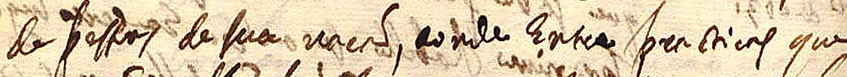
de pessoas de sua nacaõ, aonde Entre practicas que
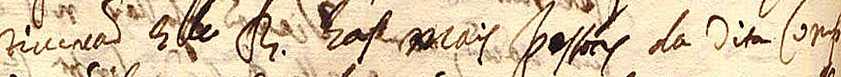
tiueraõ Elle R. E as mais pessoas da dita Comp.a
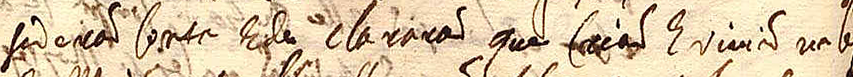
se deraõ Conta E de clararaõ que Criaõ E viuiaõ na lej
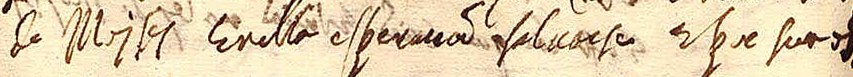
de Mojses E nella esperauaõ saluarse E por sua obs
